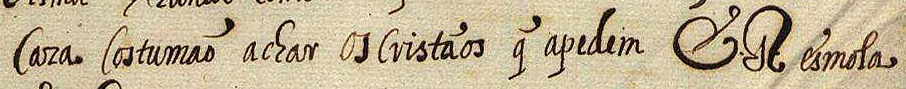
Caza Costumaõ achar os cristãos q̄ a pedem E. R esmola
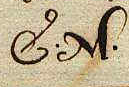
E. M.
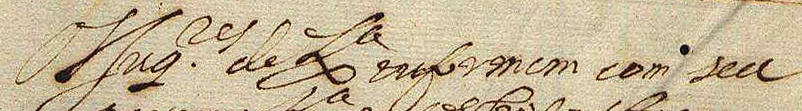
Os Jnq.res de Lx.a informem com seu
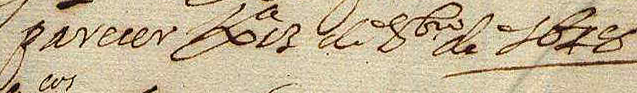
parecer Lxa 13 de 8bro. de 1648
